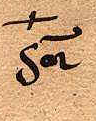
Sōr
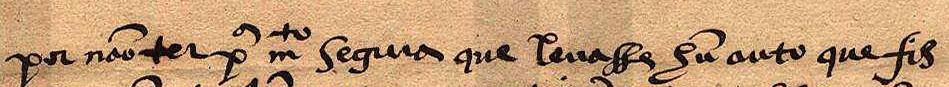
por naõ ter pa mto segura que leuasse hū auto que fis
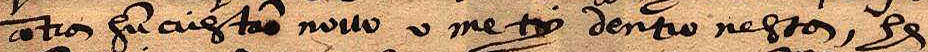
c̄otra hū cristão nouo o mety dentro nesta, he
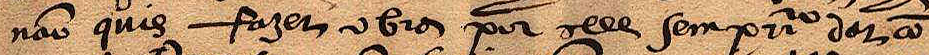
não quis fazer obra por elle sem priro dar c̄o
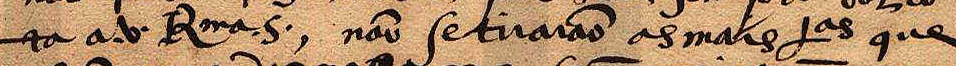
ta a .v. Rma .S., não se tirarão as mais tas que
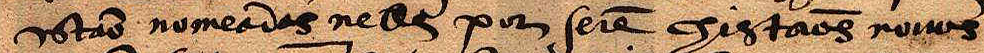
estaõ nomeadas nelle por serē chistaõs nouos
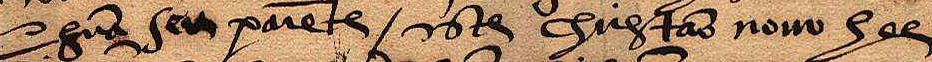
e hūa seu parēte / este christão nouo hee
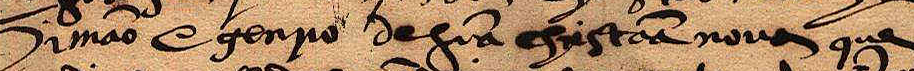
Jrmão e genrro de huā christaā noua que
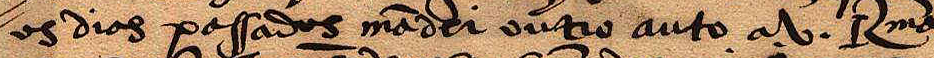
os dias passados mādei outro auto a .v. Rma
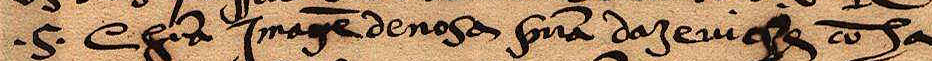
.S. e hūa Jmagē de nosa snrā dazeuiche c̄o ha
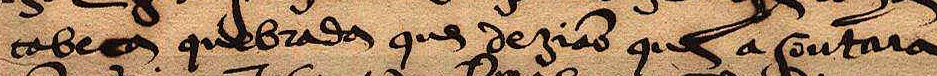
cabeça quebrada que deziaõ que asoutara
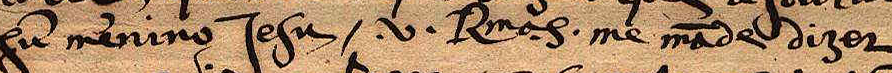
hū menino Jesu / .v. Rma .S. me māde dizer
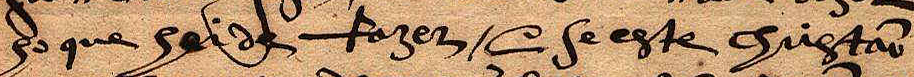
ho que hei de fazer / e se este christão
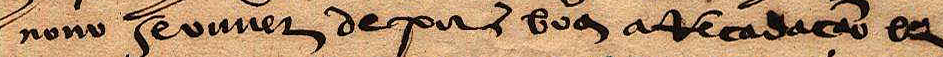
nouo se ouuer de por ē boa aRecadação eu
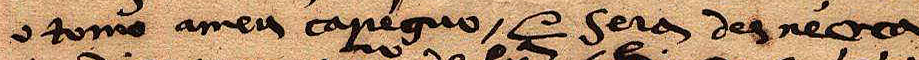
o tomo a meu carreguo / e sera desneceça
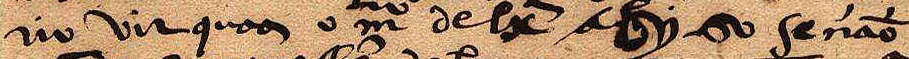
rio vir quaa o mro de lxa a hyso senão
